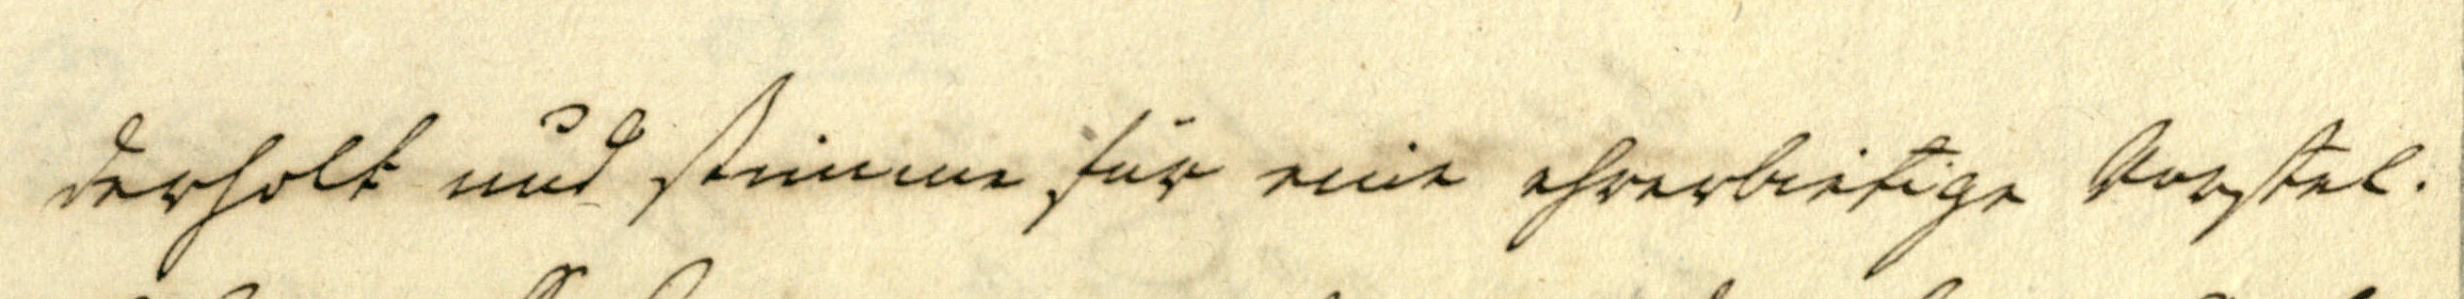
derholt und stimme für eine ehrerbietige Vorstel¬
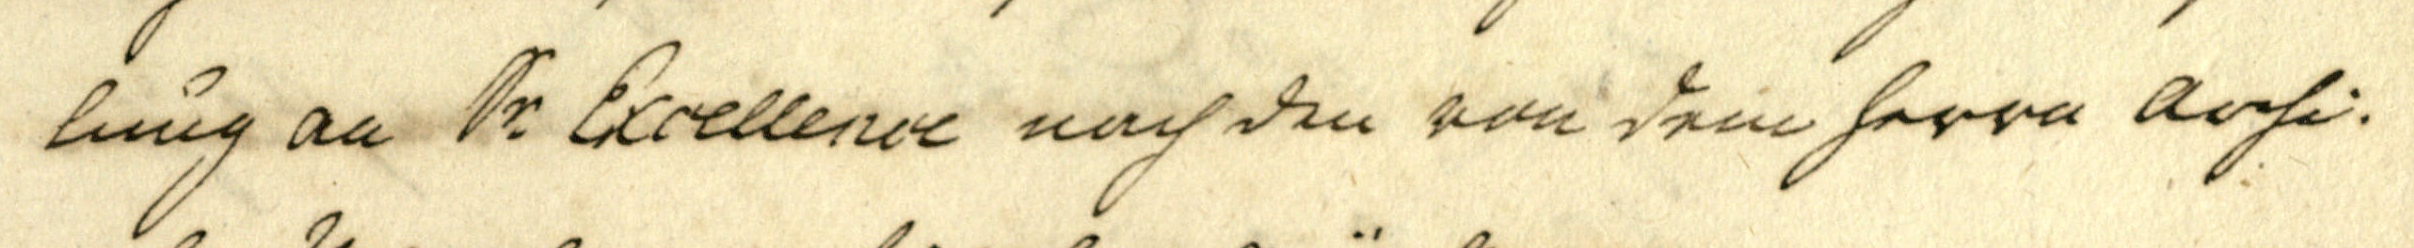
lung an Sr Excellence nach den von dem Herrn Archi¬
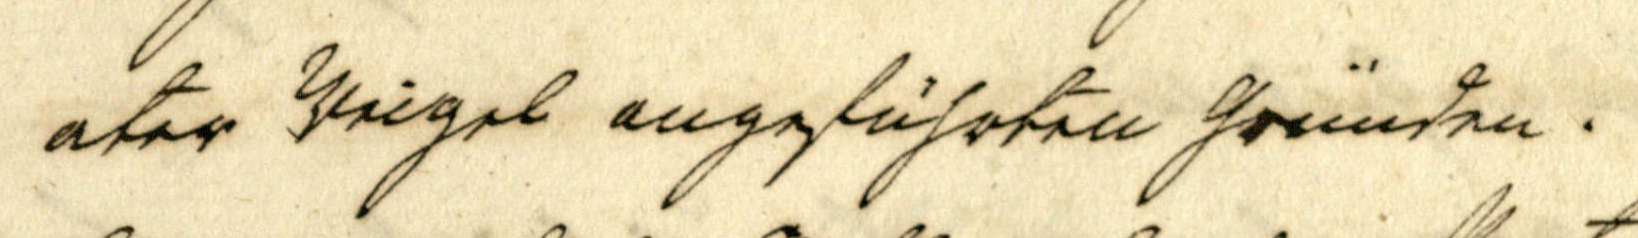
ater Weigel angeführten Gründen.
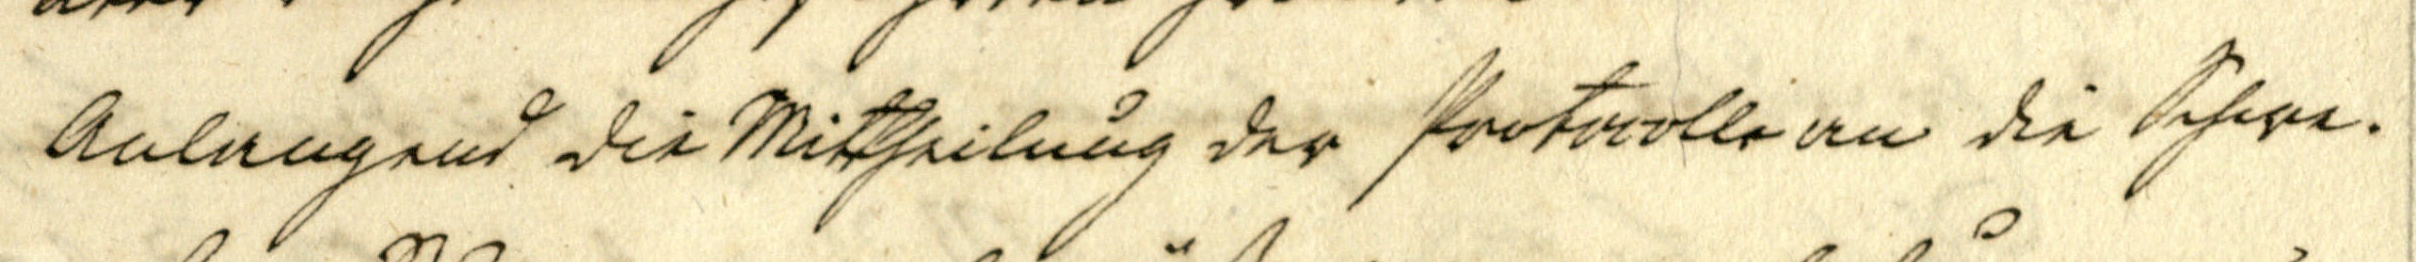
Anlangend die Mittheilung der Protocolle an die Schwe¬
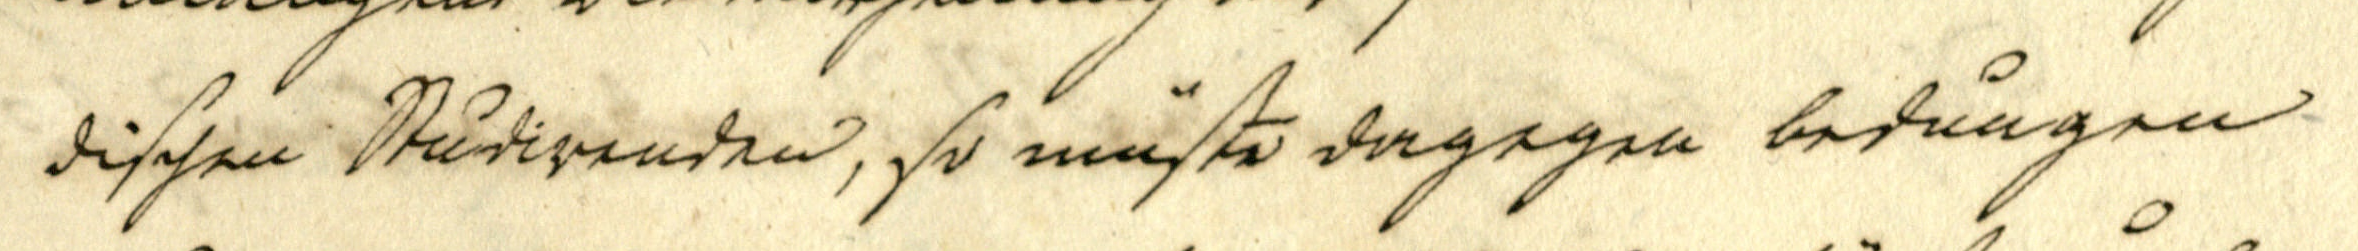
dischen Studirenden, so müßte dagegen bedungen
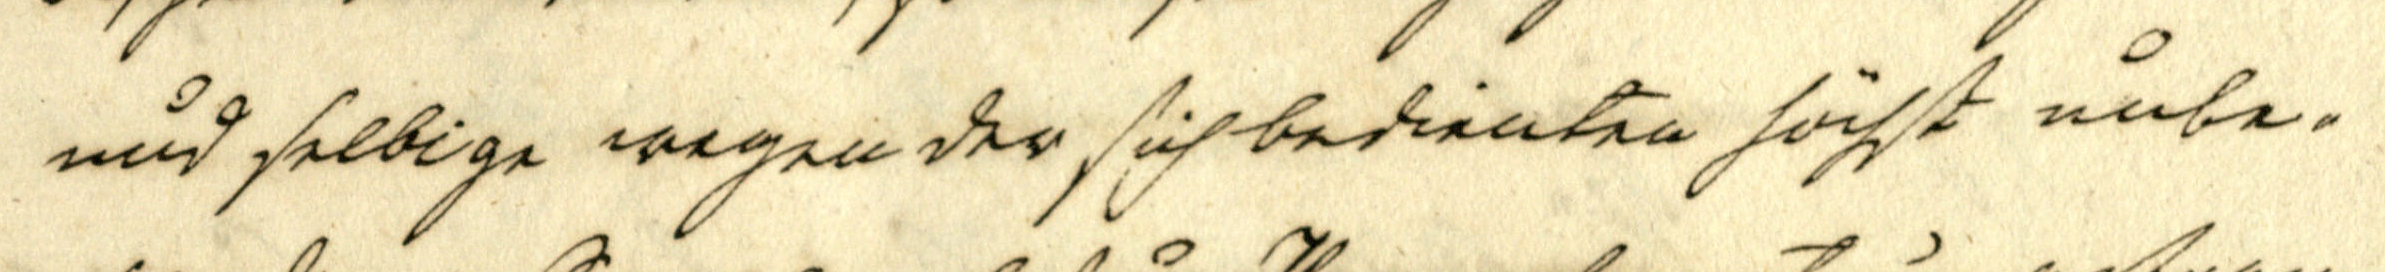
und selbige wegen der sich bedienten höchst unbe¬
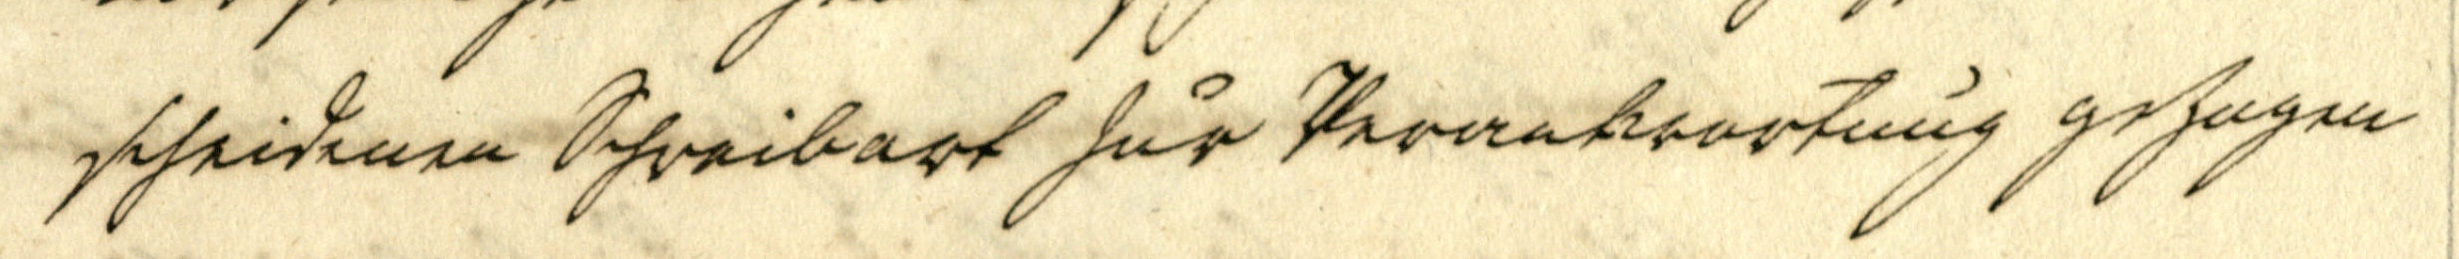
scheidenen Schreibart zur Verantwortung gezogen
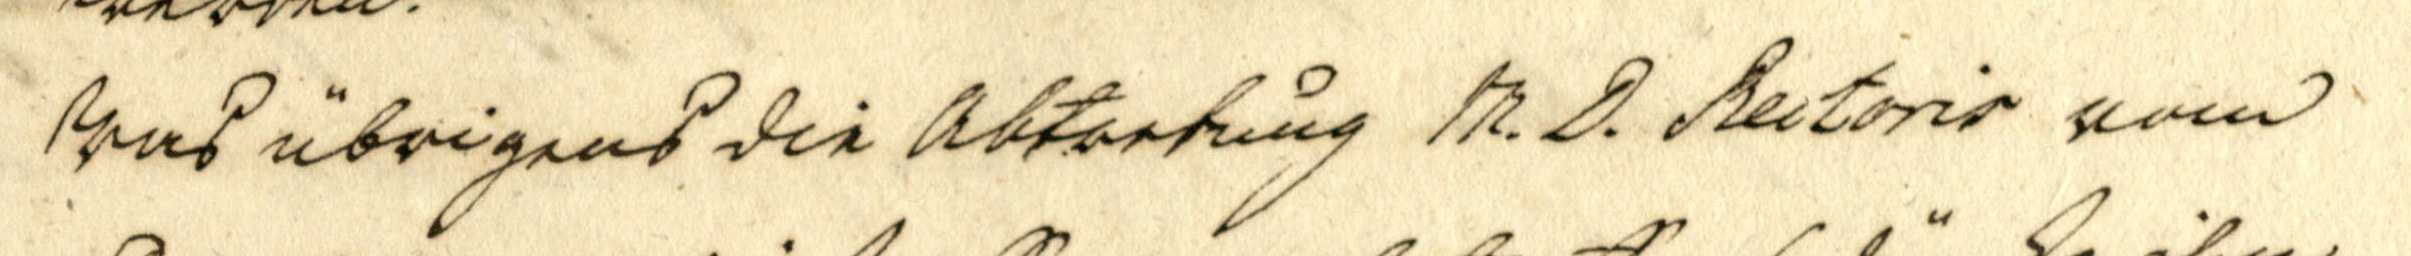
Was übrigens die Abtretung M. D. Rectoris vom
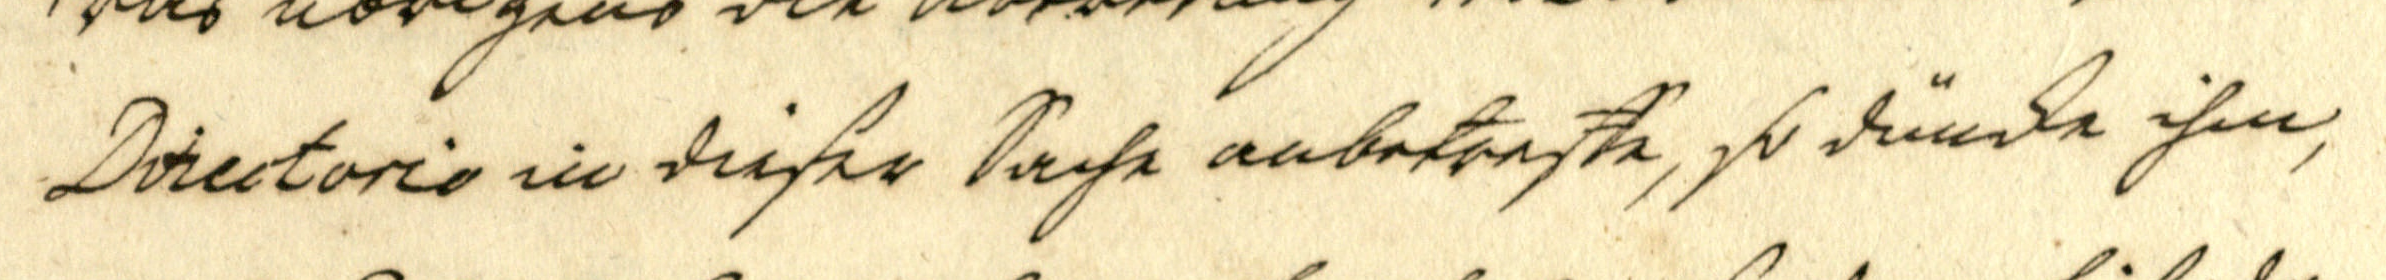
Directorio in dieser Sache anbetreffe, so düncke ihm,
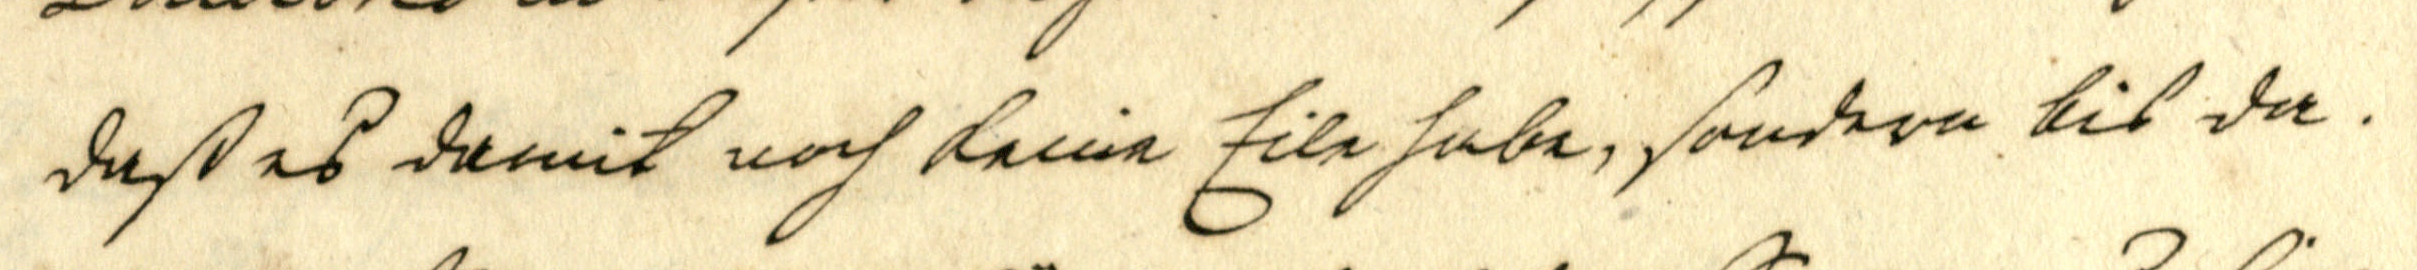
daß es damit noch keine Eile habe, sondern bis da¬
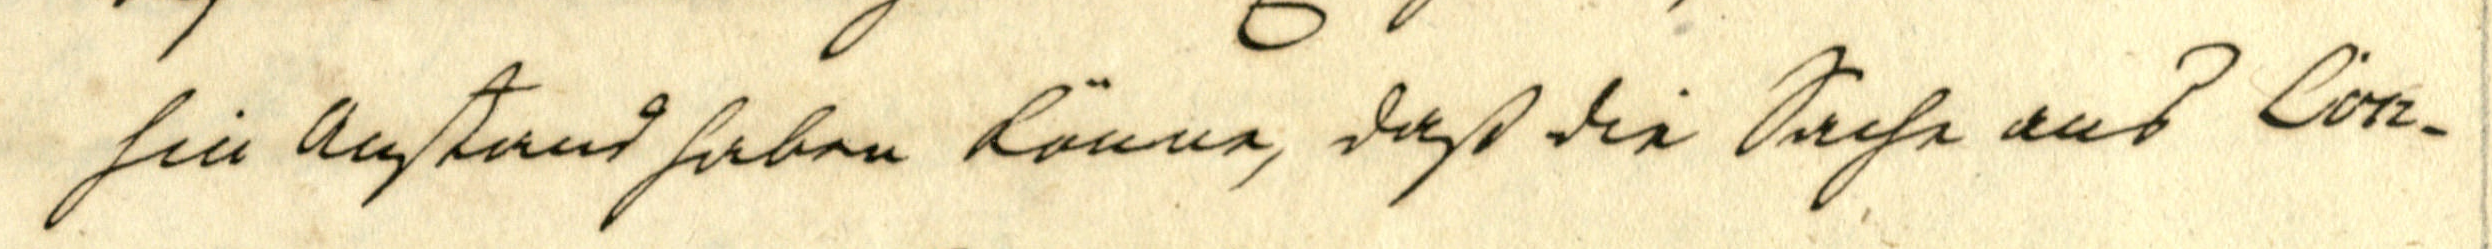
hin Anstand haben könne, daß die Sache ans Con¬
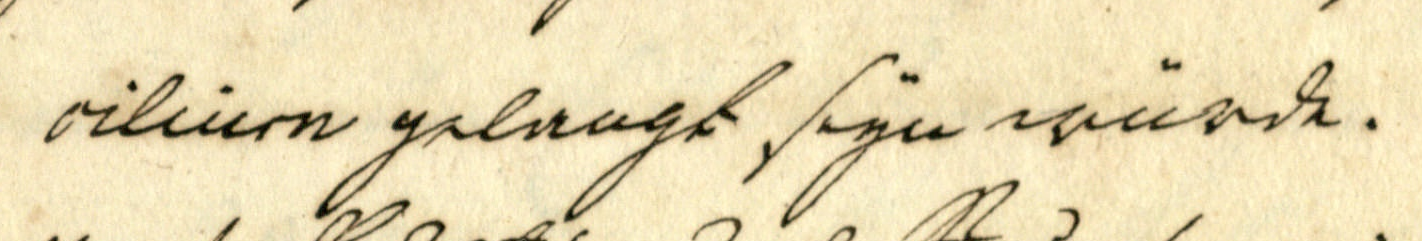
cilium gelangt seÿn würde.
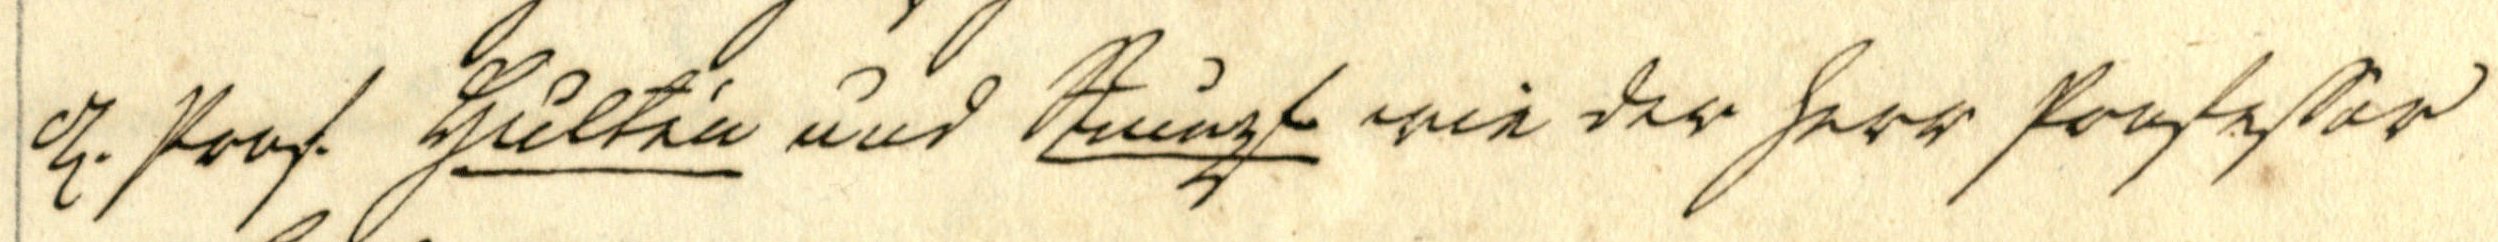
dh. Prof. Hultén und Stumpf wie der Herr Professor
